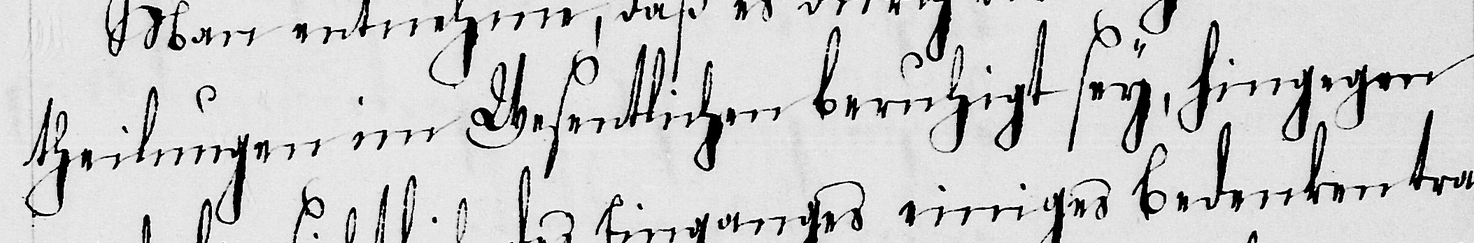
theilungen im Wesentlichen beruhigt sey, hingegen
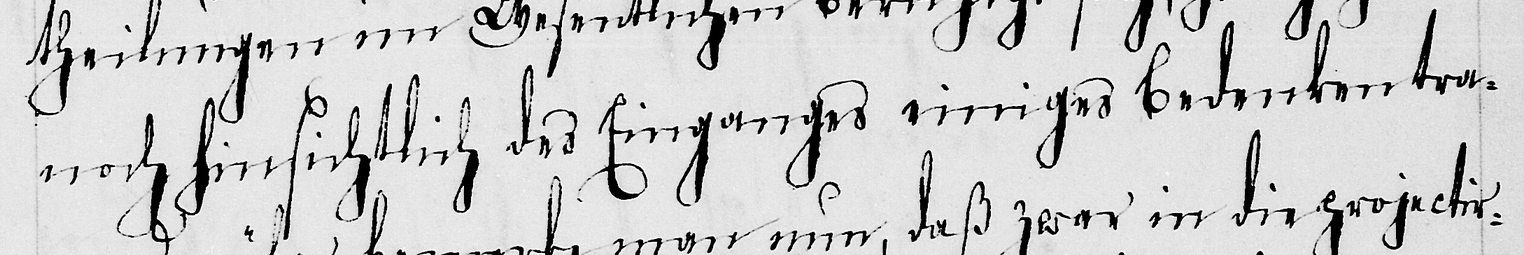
noch hinsichtlich des Einganges einiges Bedenken tra¬
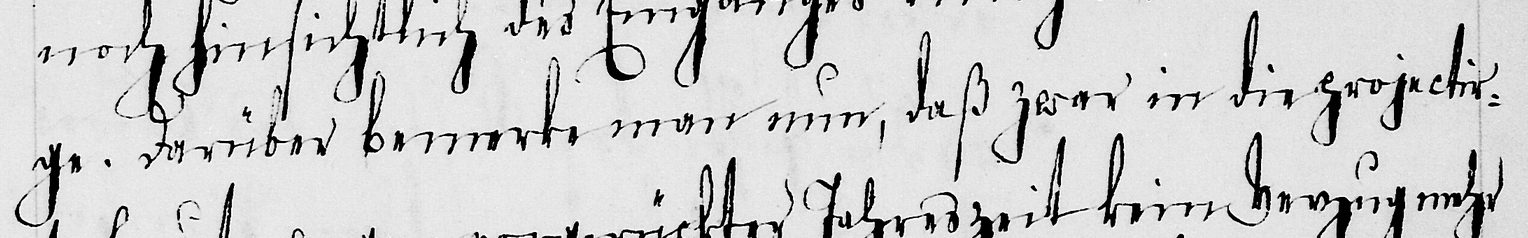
ge. Darüber bemerke man nun, daß zwar in die projectir¬
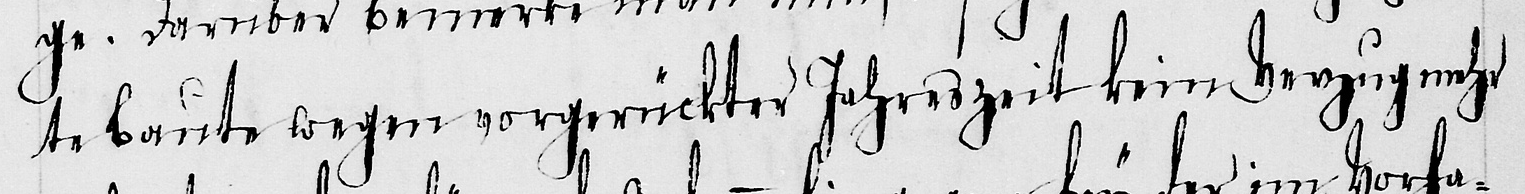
te Baute wegen vorgerückter Jahreszeit kein Verzug mehr
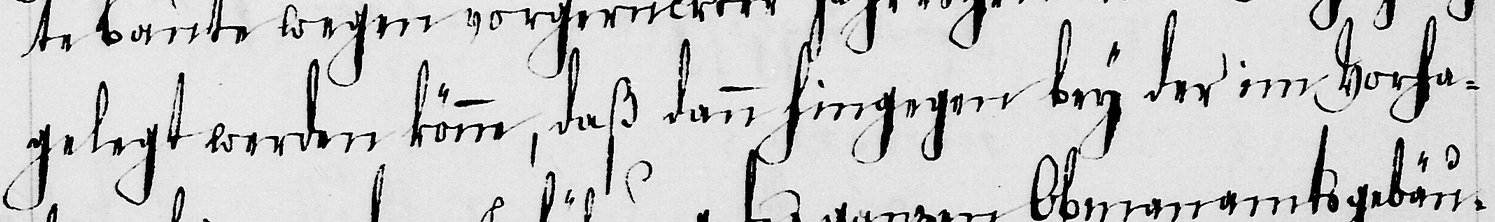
gelegt werden könne, daß dann hingegen bey der im Vorha¬
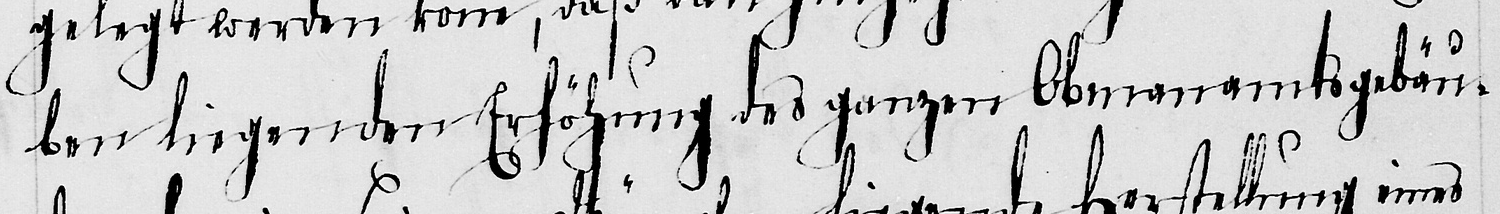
ben liegenden Erhöhung des ganzen Obmannamtsgebäu¬
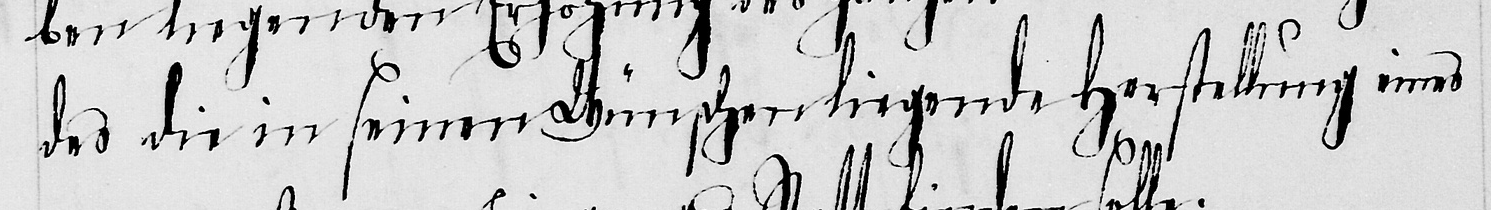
des die in seinen Wünschen liegende Herstellung eines
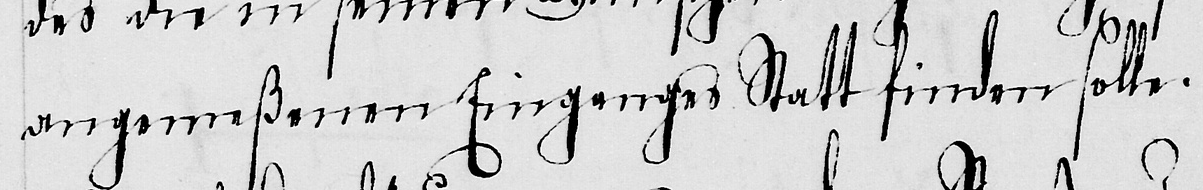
angemeßenen Einganges Statt finden solle.
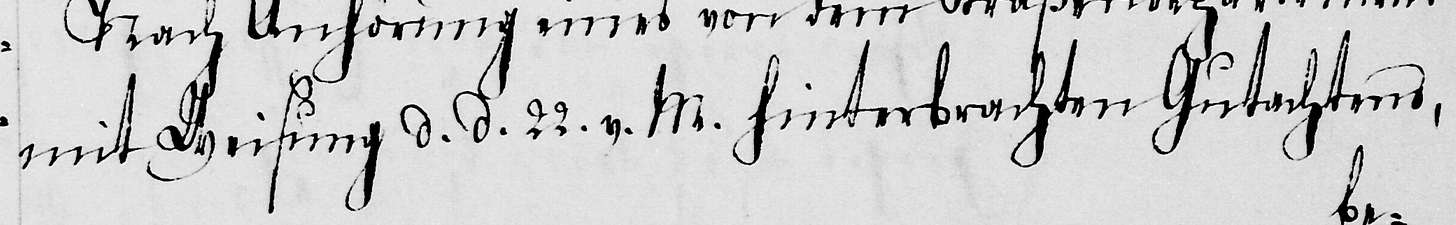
mit Weisung d. d. 22. v. M. hinterbrachten Gutachtens,
